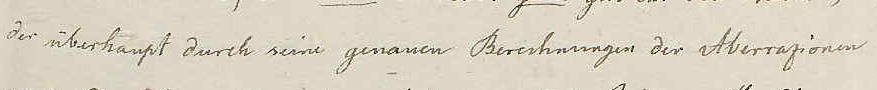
der überhaupt durch seine genauen Berechnungen der Aberrazionen
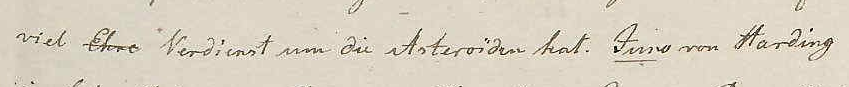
viel Ehre Verdienst um die Asteroïden hat. Juno von Harding
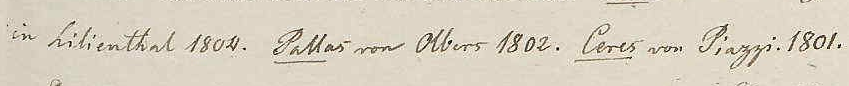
in Lilienthal 1804. Pallas von Olbers 1802. Ceres von Piazzi. 1801.
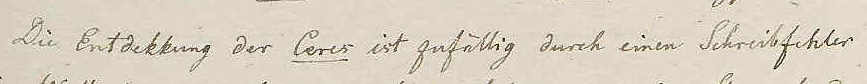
Die Entdekkung der Ceres ist zufällig durch einen Schreibfehler
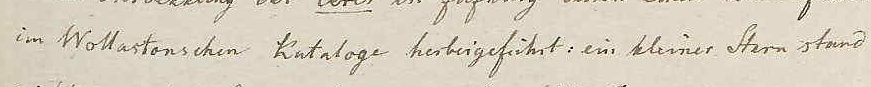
im Wollastonschen Kataloge herbeigeführt: ein kleiner Stern stand
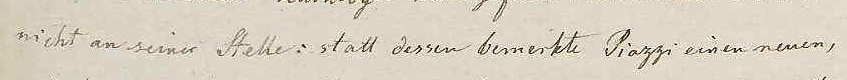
nicht an seiner Stelle: statt dessen bemerkte Piazzi einen neuen,
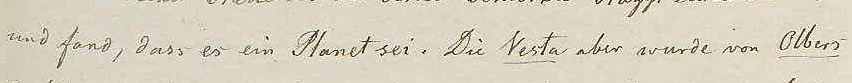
und fand, dass es ein Planet sei. Die Vesta aber wurde von Olbers
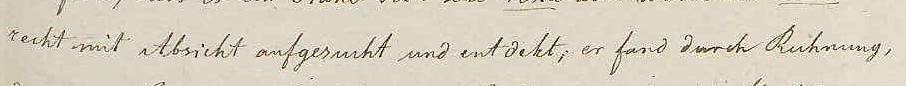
recht mit Absicht aufgesucht und entdekt; er fand durch Rechnung,
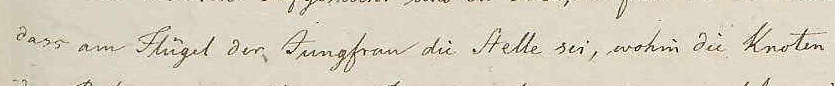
dass am Flügel den Jungfrau die Stelle sei, wohin die Knoten
